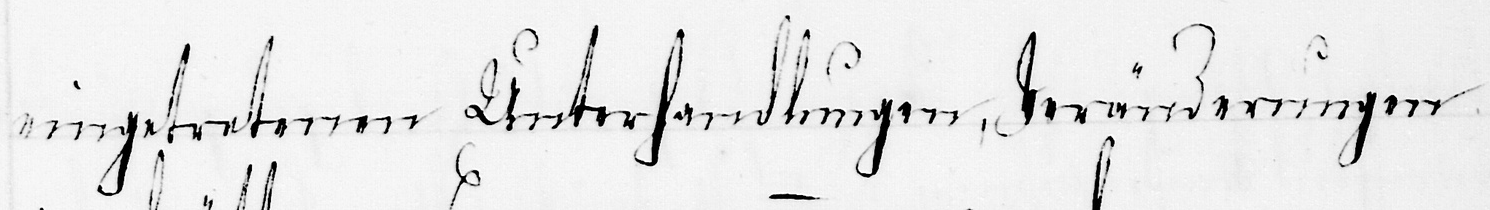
eingetretenen Unterhandlungen, Veränderungen
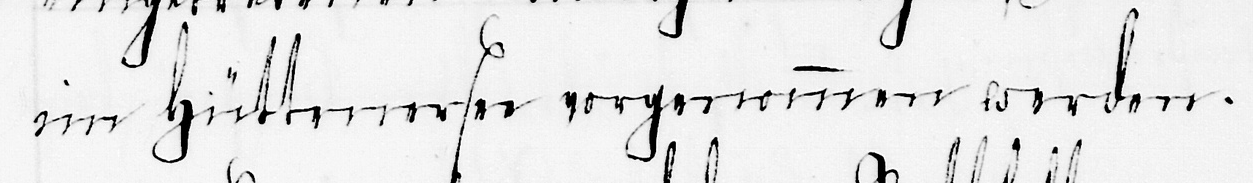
im Hüttenersee vorgenommen werden.
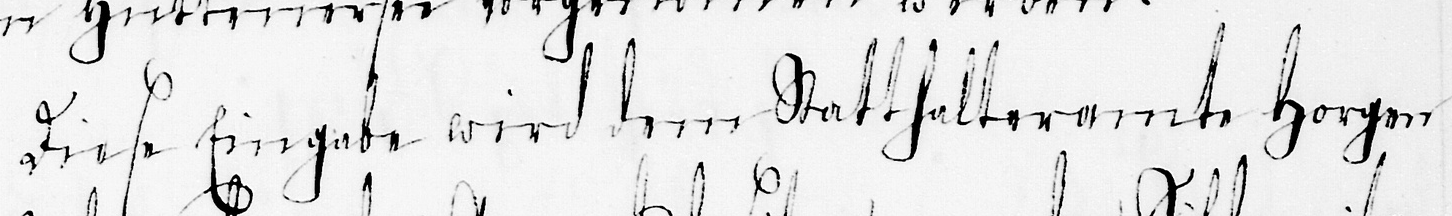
Diese Eingabe wird dem Statthalteramte Horgen
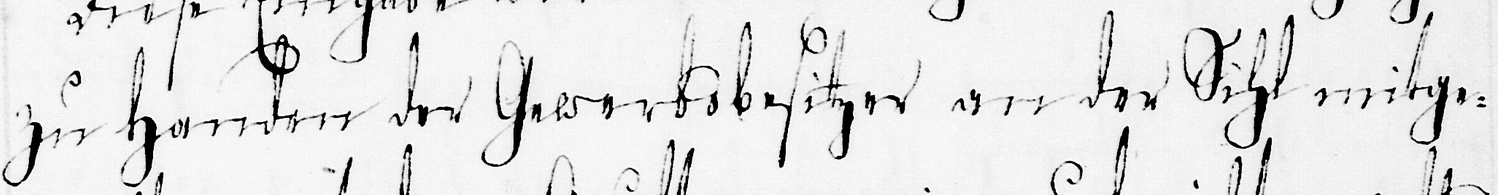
zu Handen der Gewerbsbesitzer an der Sihl mitge¬
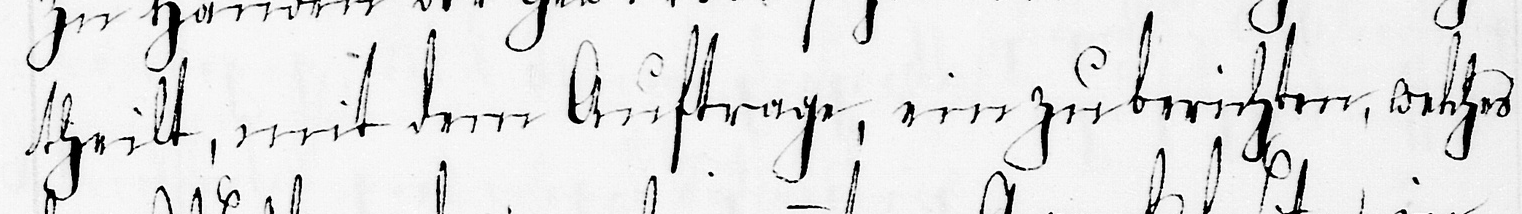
theilt, mit dem Auftrage, einzuberichten, welches
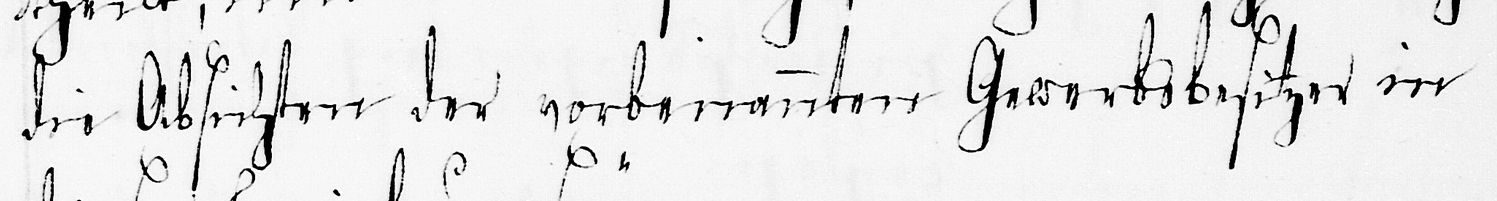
die Absichten der vorbenannten Gewerbsbesitzer in
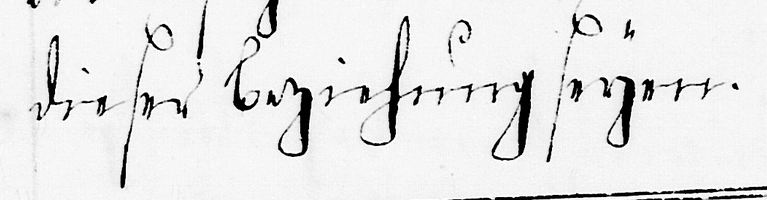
dieser Beziehung seyen.
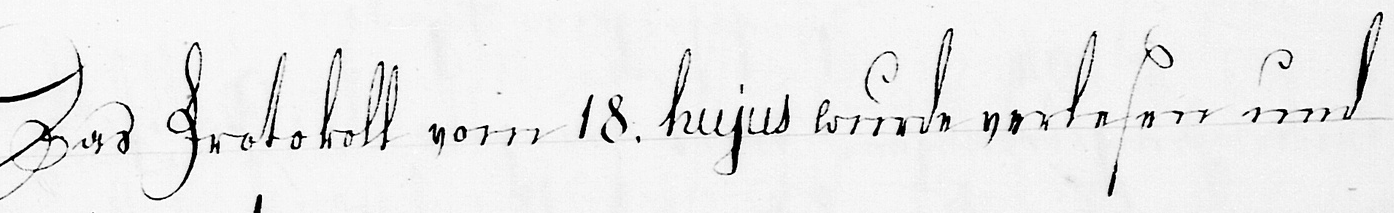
Das Protokoll vom 18. hujus wurde verlesen und
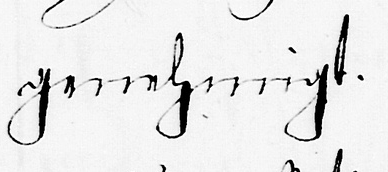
genehmigt.
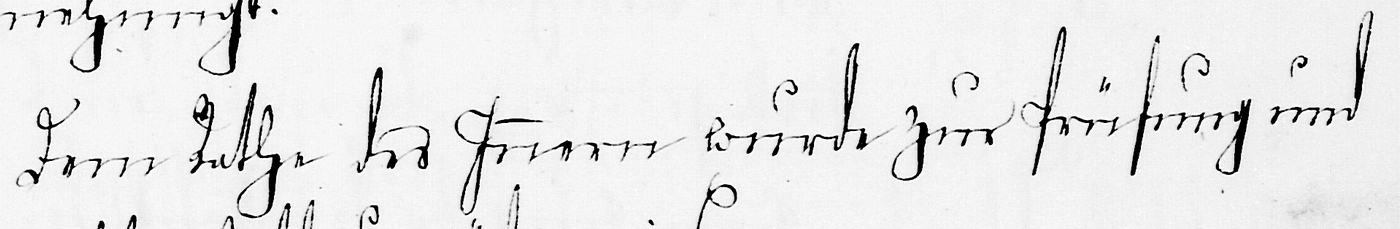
Dem Rathe des Innern wurde zur Prüfung und
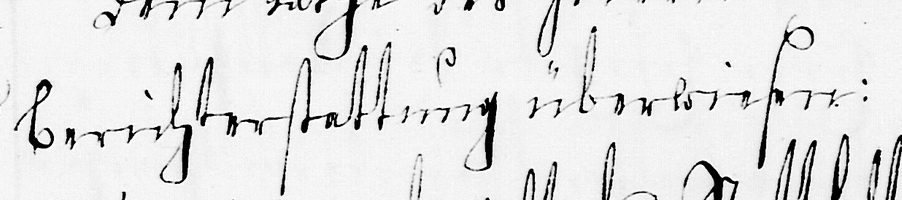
Berichterstattung überwiesen:
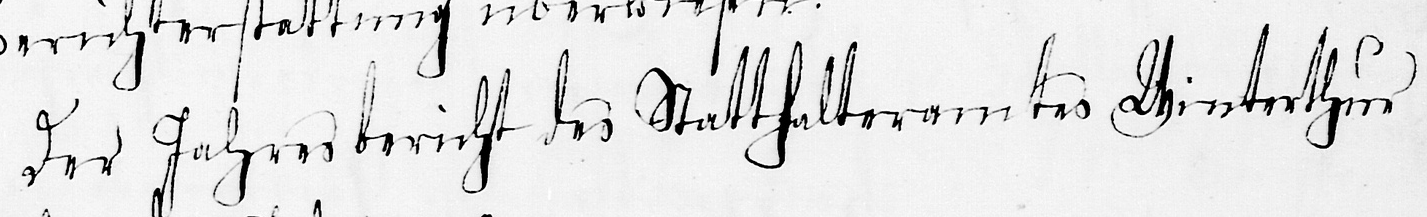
Der Jahresbericht des Statthalteramtes Winterthur
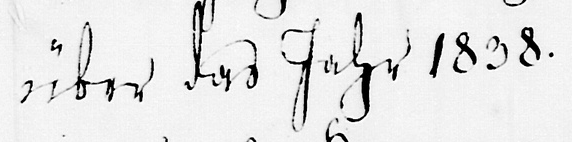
über das Jahr 1838.
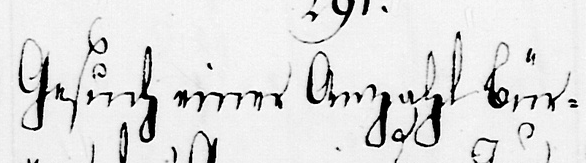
Gesuch einer Anzahl Bür¬
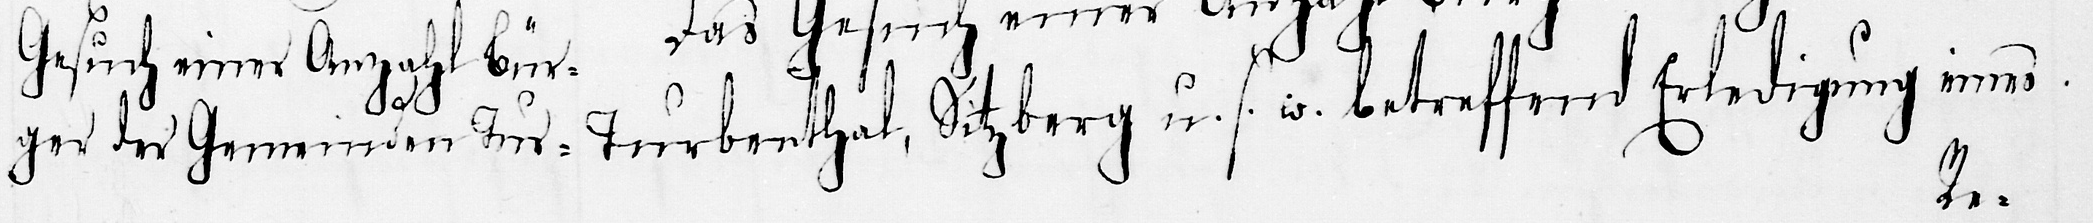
ger der Gemeinden Turbenthal, Sitzberg u. s. w. betreffend Erledigung eines
